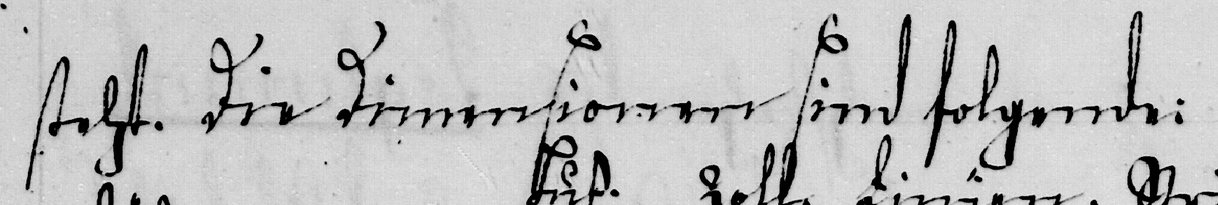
steht. Die Dimensionen sind folgende:
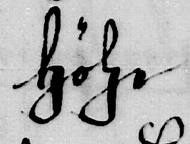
Höhe
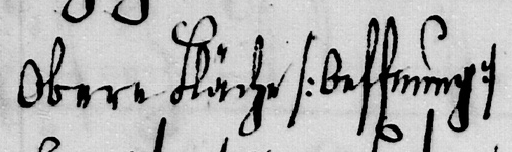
Obere Fläche [Oeffnung]
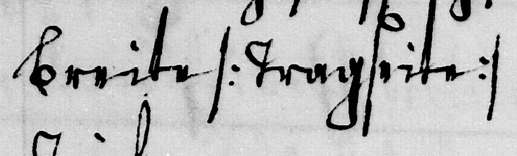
Breite [Tragseite]
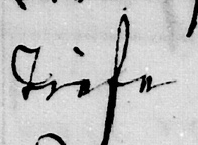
Tiefe
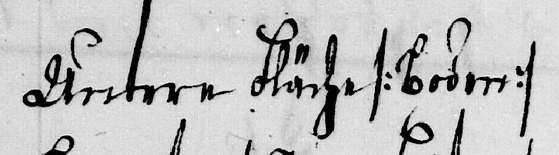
Untere Fläche [Boden]
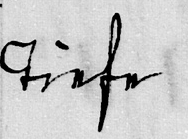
Tiefe
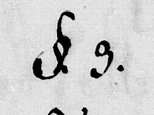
§. 3.
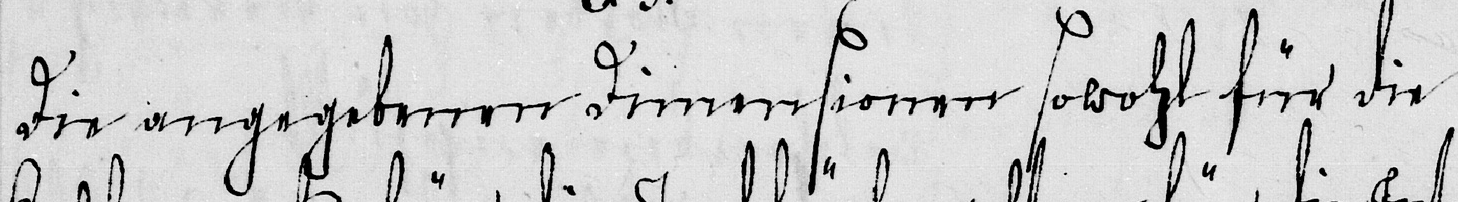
Die angegebenen Dimensionen sowohl für die
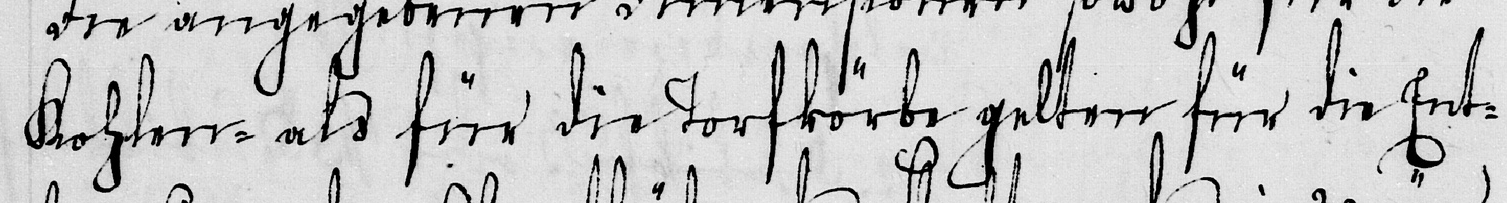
Kohlen- als für die Torfkörbe gelten für die Ent¬
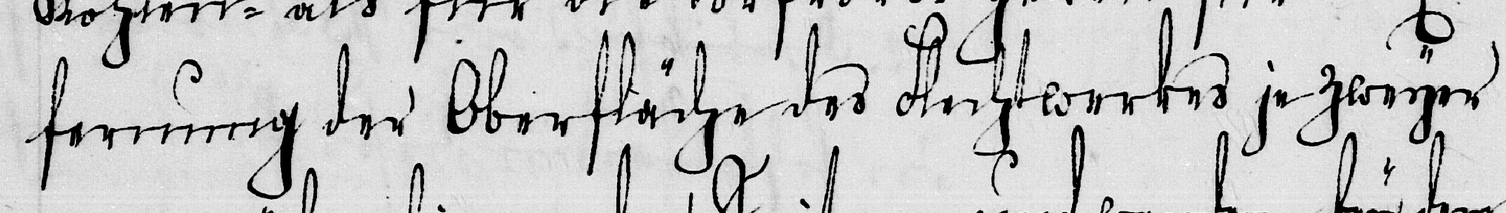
fernung der Oberfläche des Flechtwerkes je zweyer
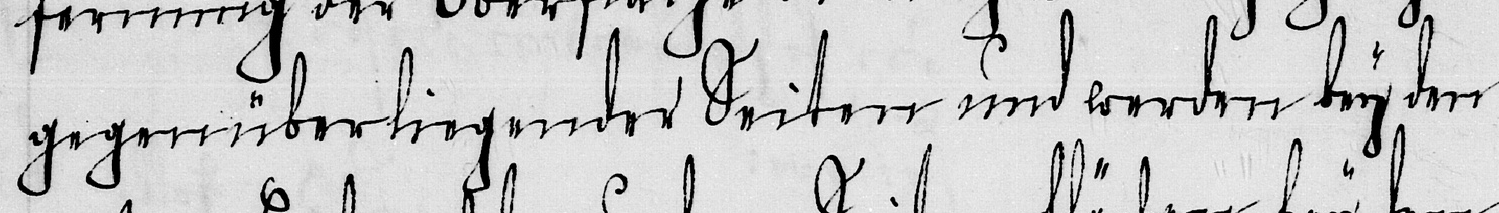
gegenüberliegender Seiten und werden bey den
